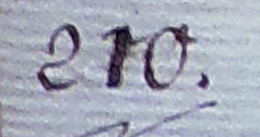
210.
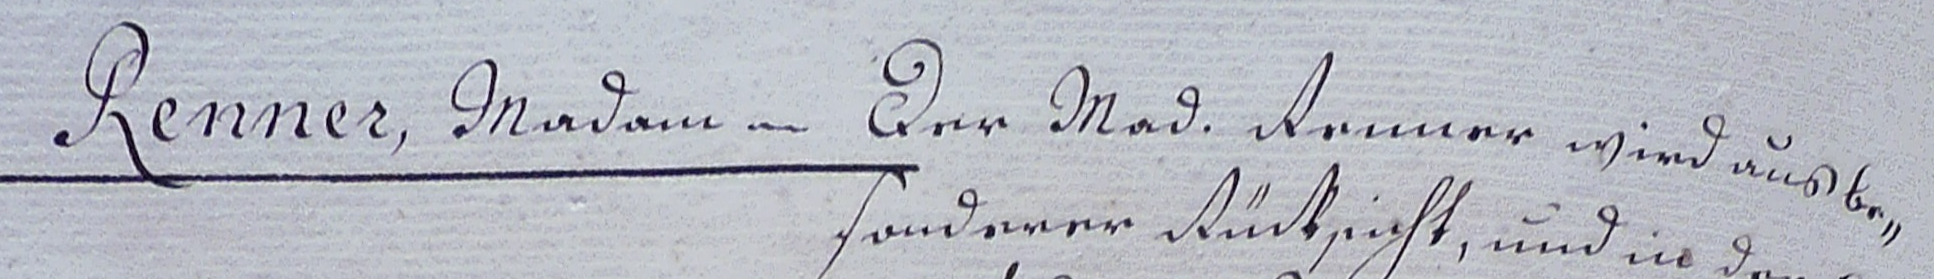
Renner, Madam .... Der Mad. Renner wird aus be¬
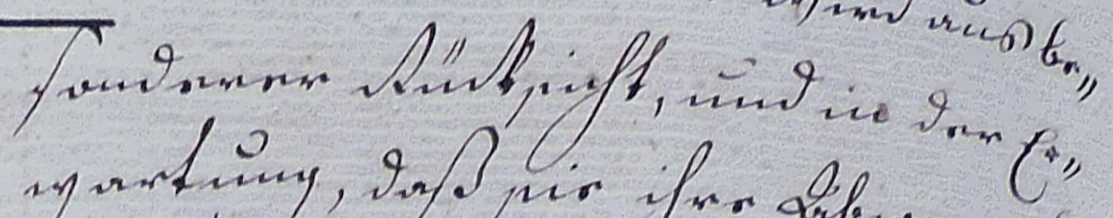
sonderer Rücksicht, und in der Er¬
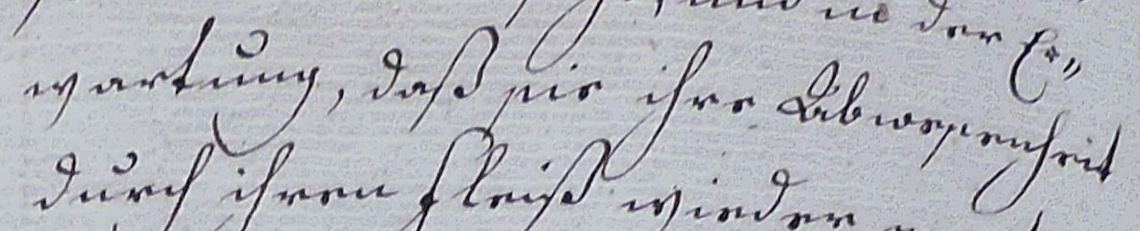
wartung, daß sie ihre Abwesenheit
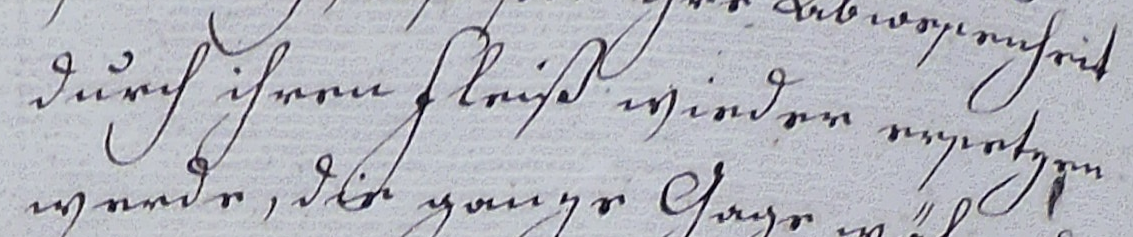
durch ihren Fleiß wieder ersetzen
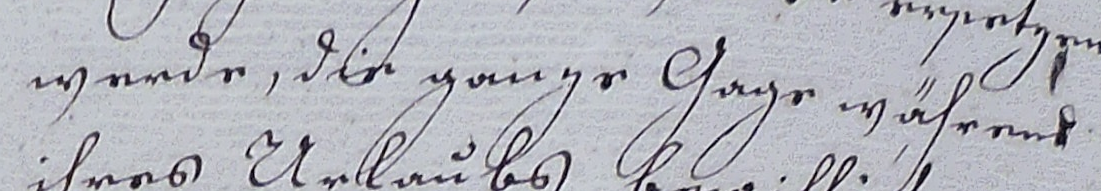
werde, die ganze Gage während
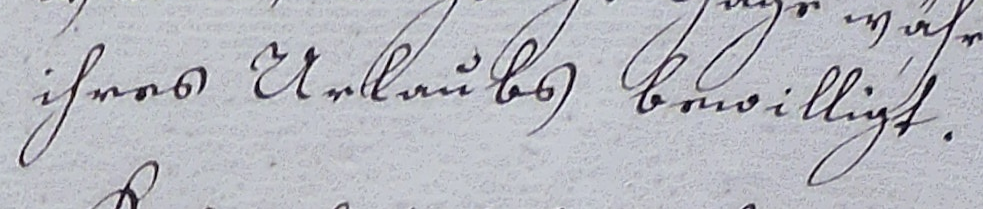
ihres Urlaubs bewilligt.
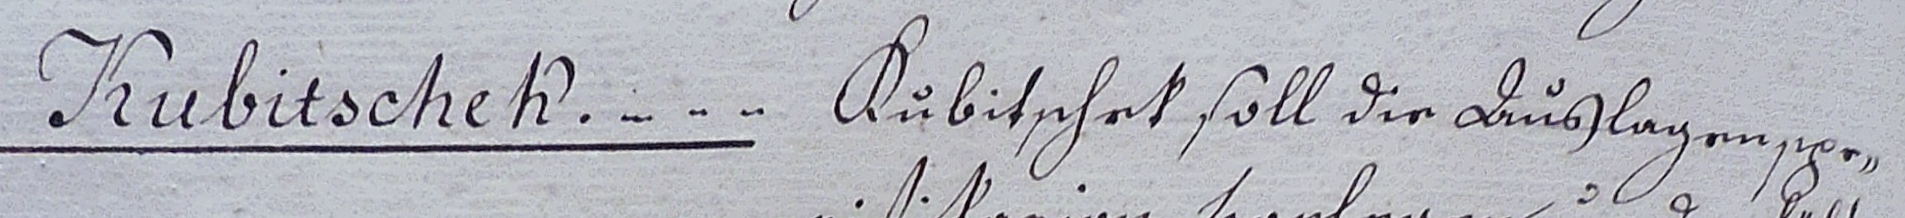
Kubitschek. .. .. .. Kubitschek soll die Auslagenspe¬
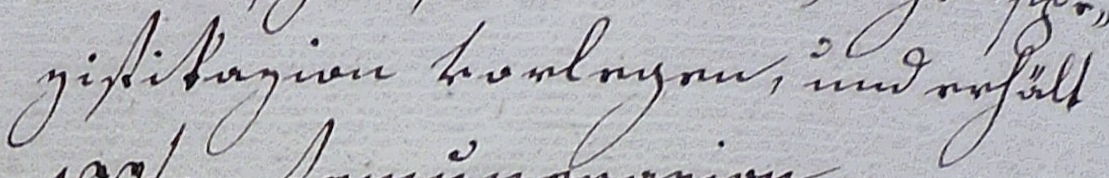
zifikazion vorlegen, und erhält
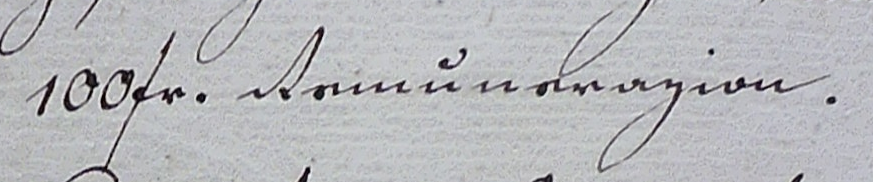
100fr. Remunerazion.
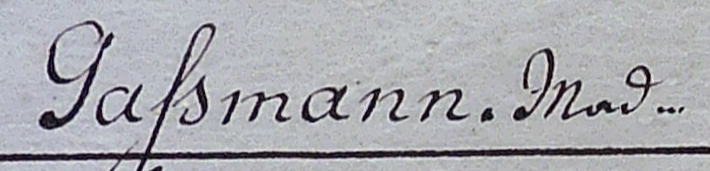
Gassmann, Mad ...
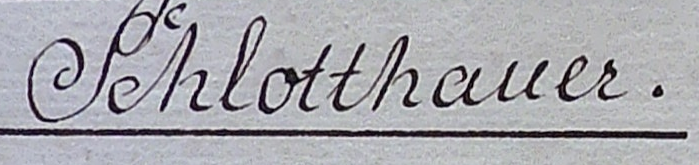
Schlotthauer.
